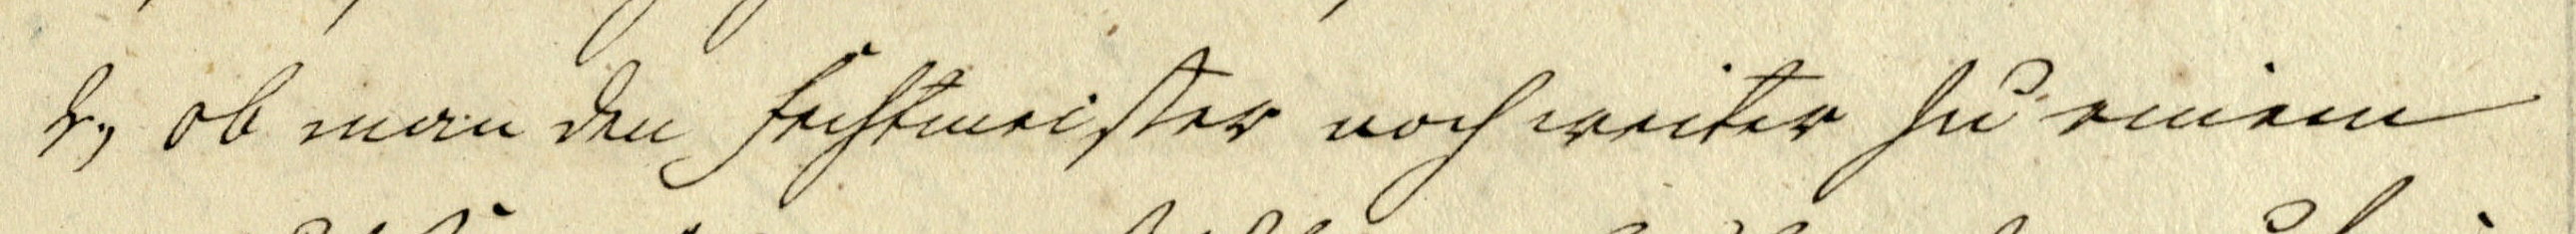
2., ob man den Fechtmeister noch weiter zu einem
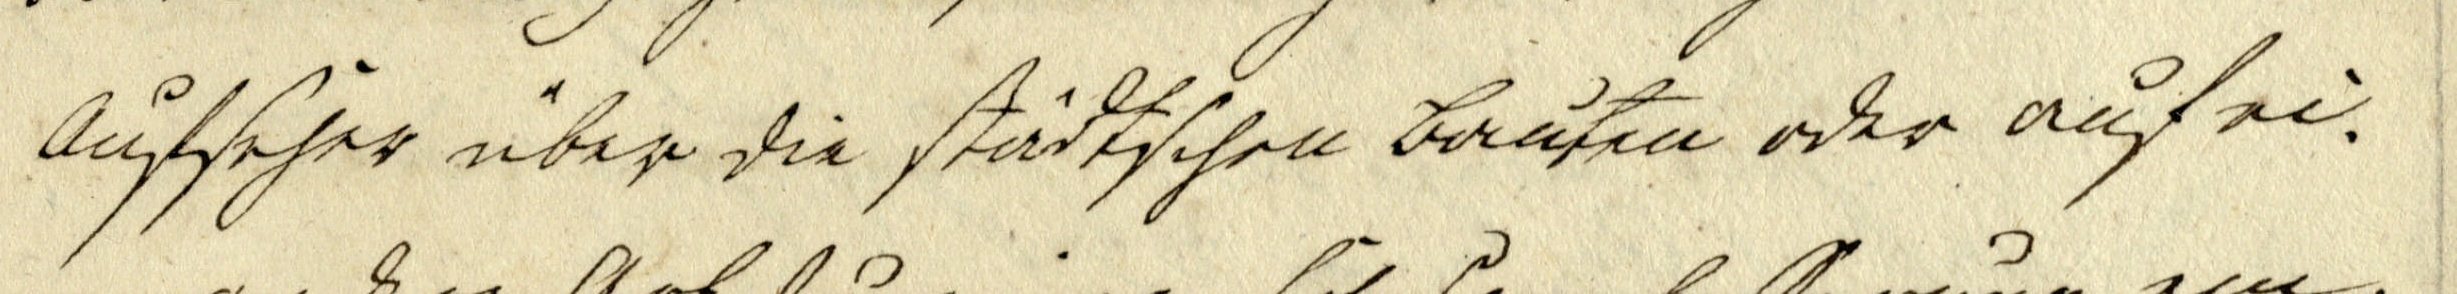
Aufseher über die städtschen Bauten oder auf ei¬
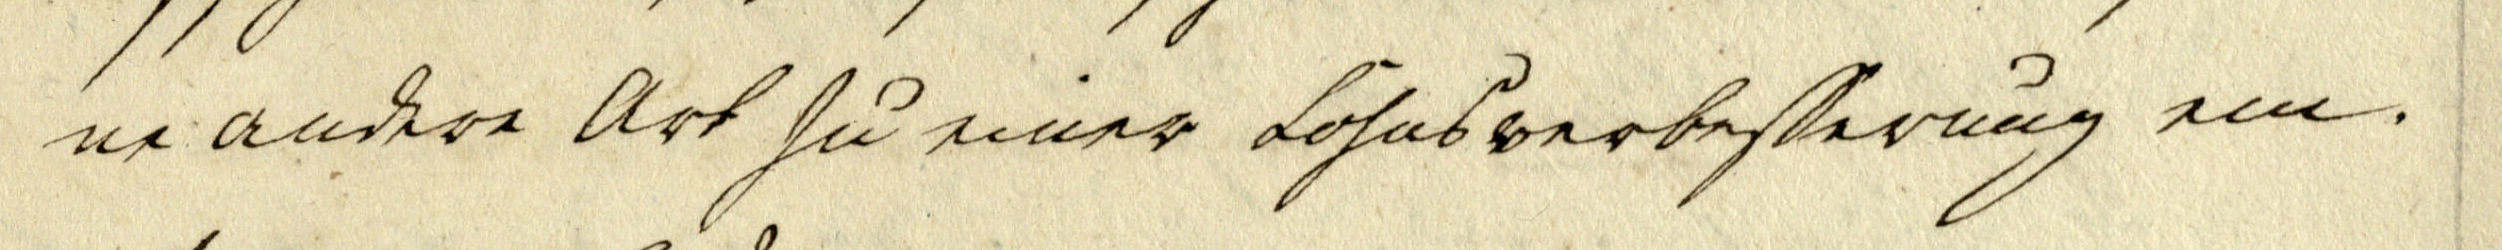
ne andere Art zu einer Lohnsverbesserung em¬
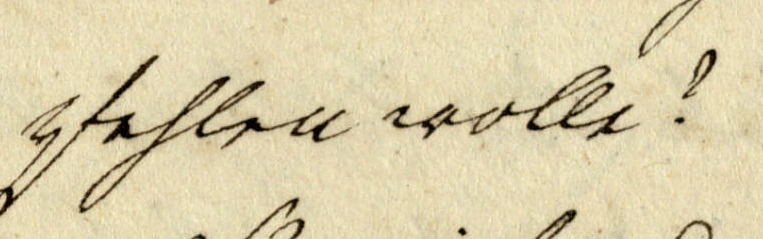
pfehlen wolle?
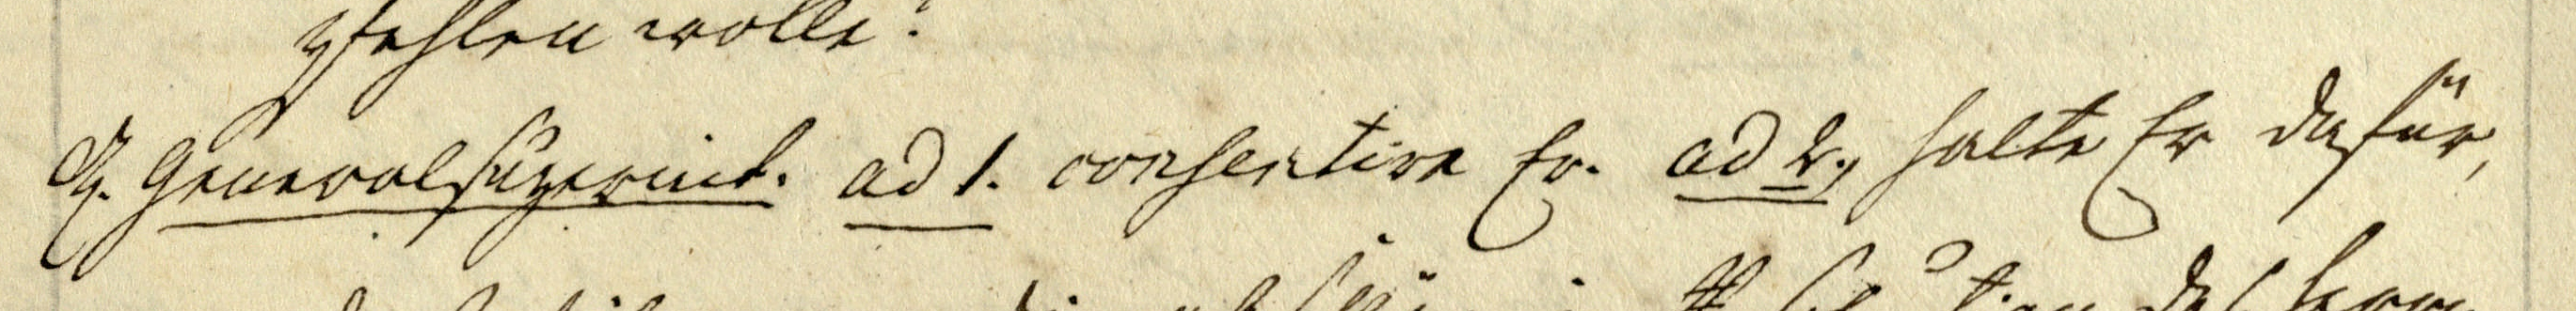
dh. Generalsuperint. ad 1. consentire Er. ad 2. halte Er dafür,
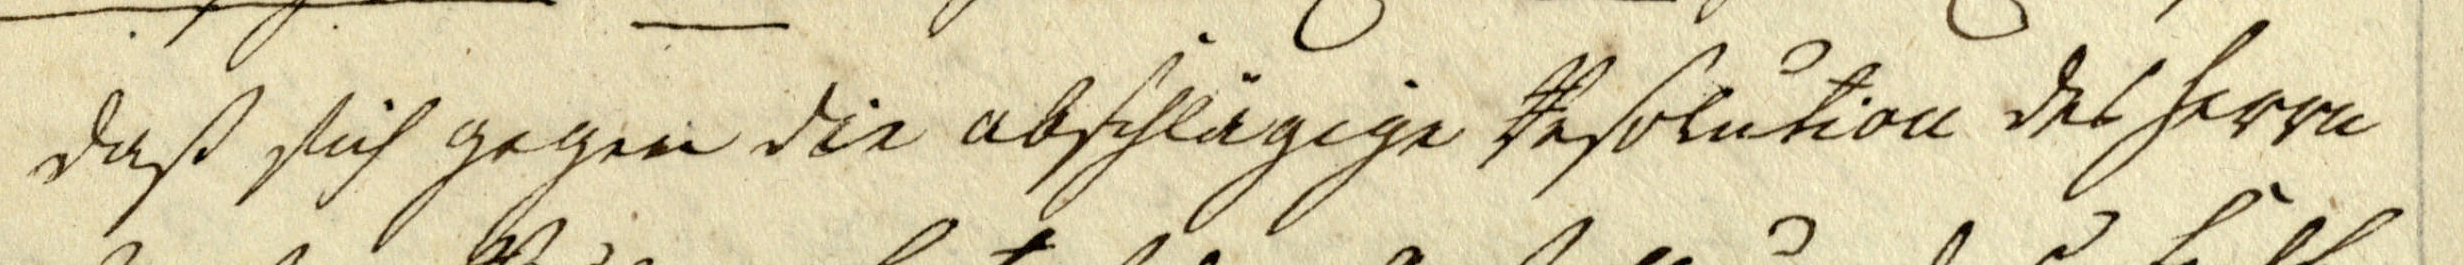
daß sich gegen die abschlägige Resolution des Herrn
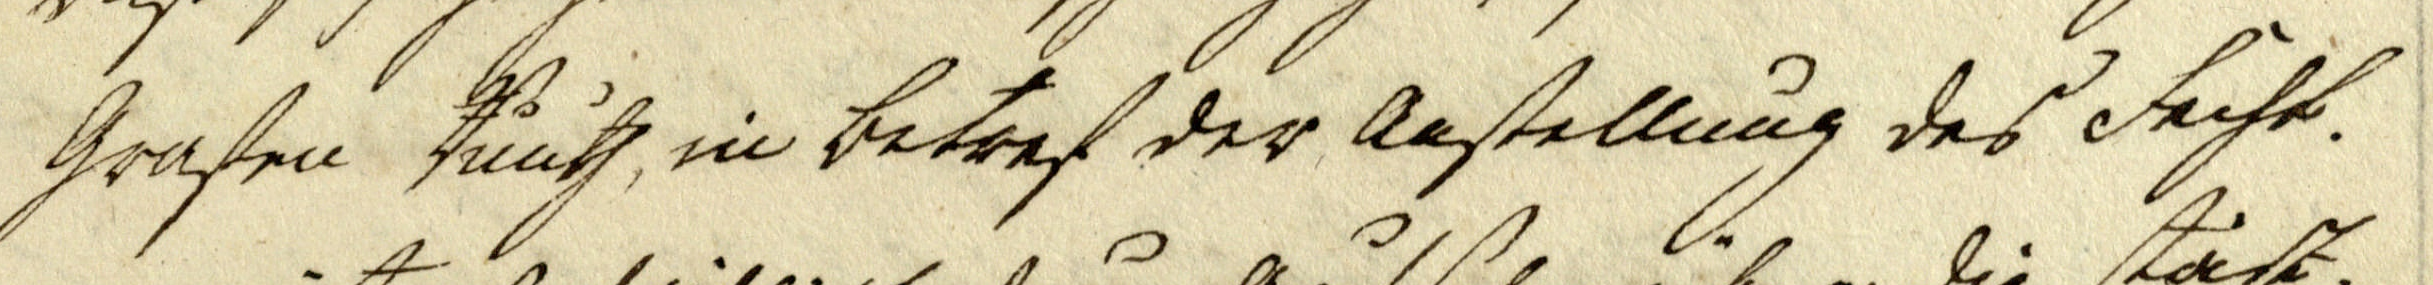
Grafen Ruuth in Betref der Anstellung des Fecht¬
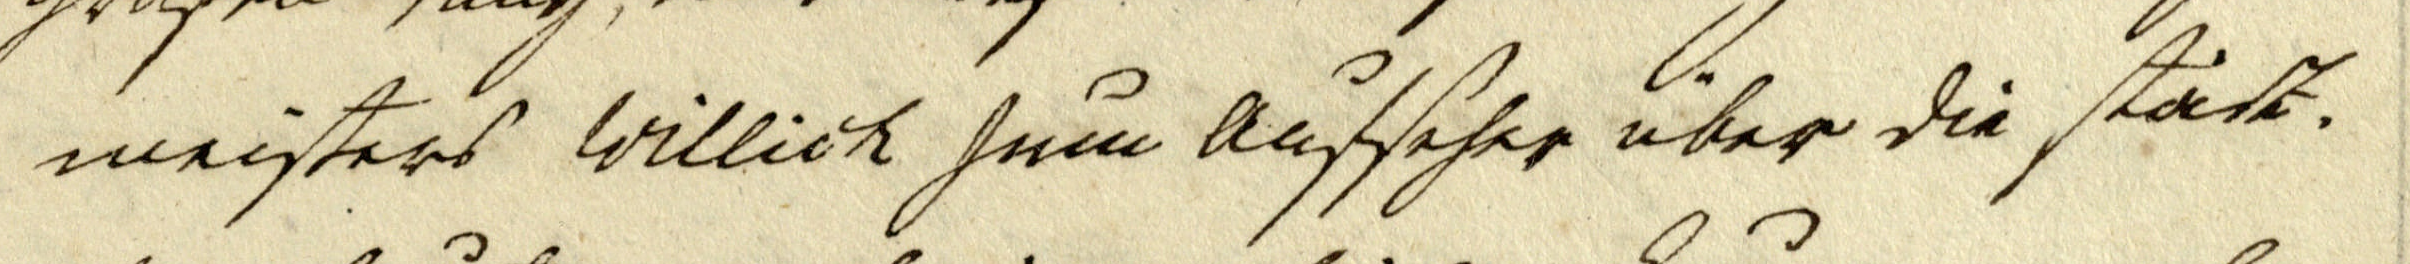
meisters Willich zum Aufseher über die städt¬
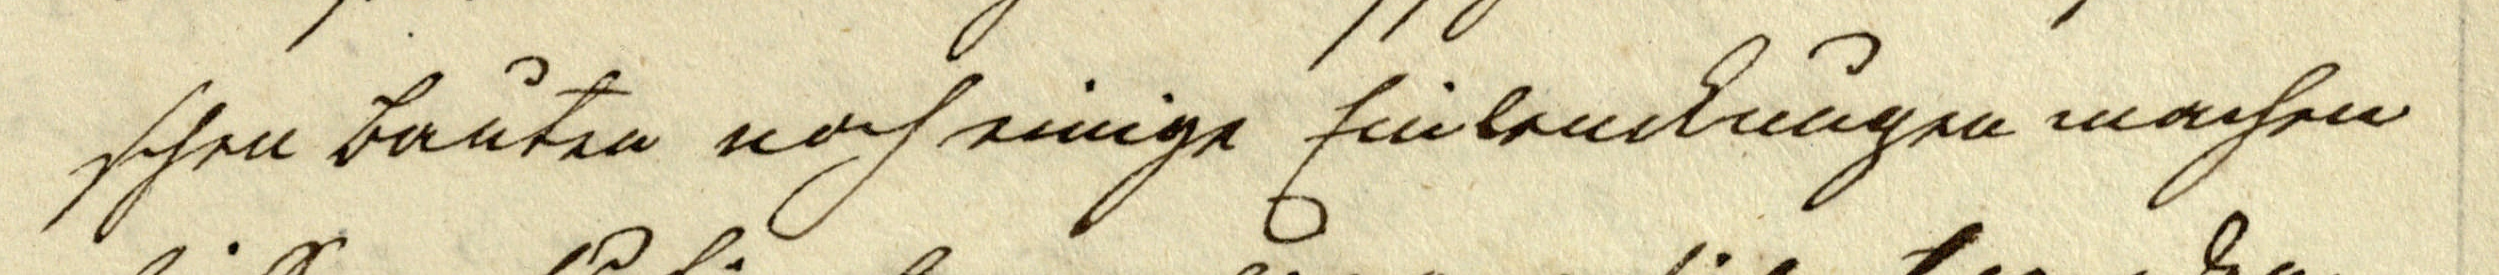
schen Bauten noch einige Einlenckungen machen
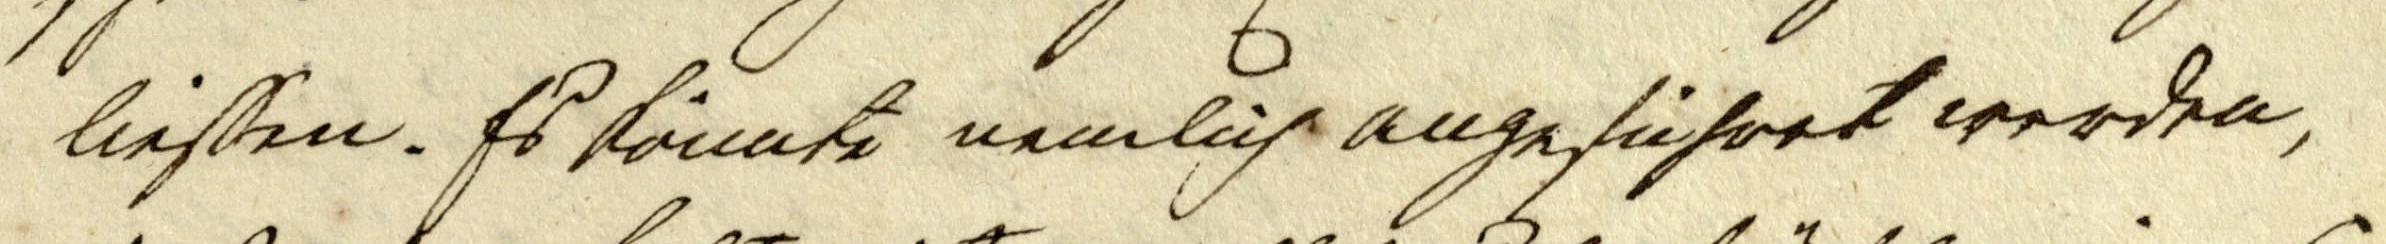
liessen. Es könnte nemlich angeführet werden,
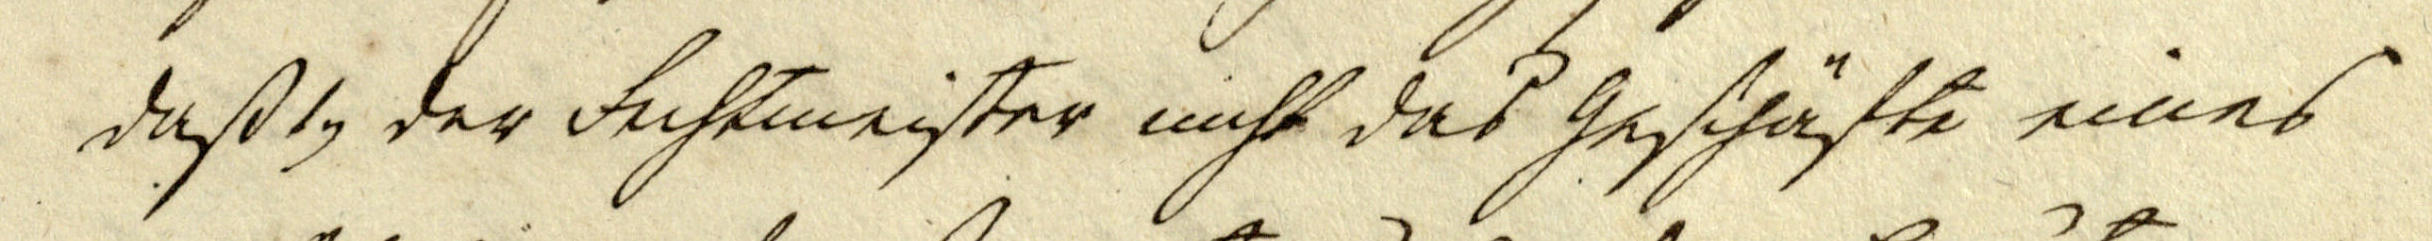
daß 1., der Fechtmeister nicht das Geschäfte eines
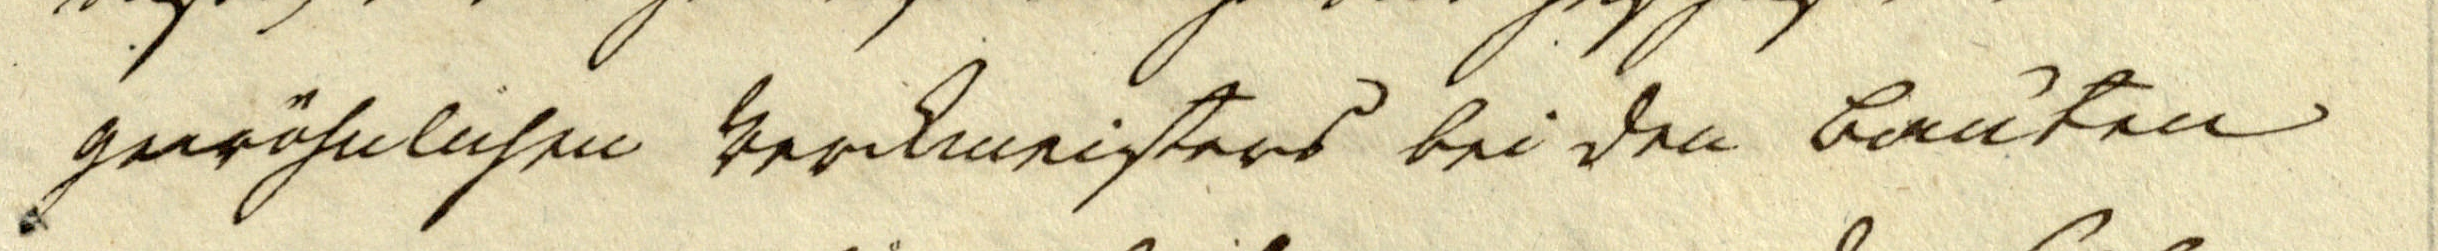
gewöhnlichen Werckmeisters bei den Bauten
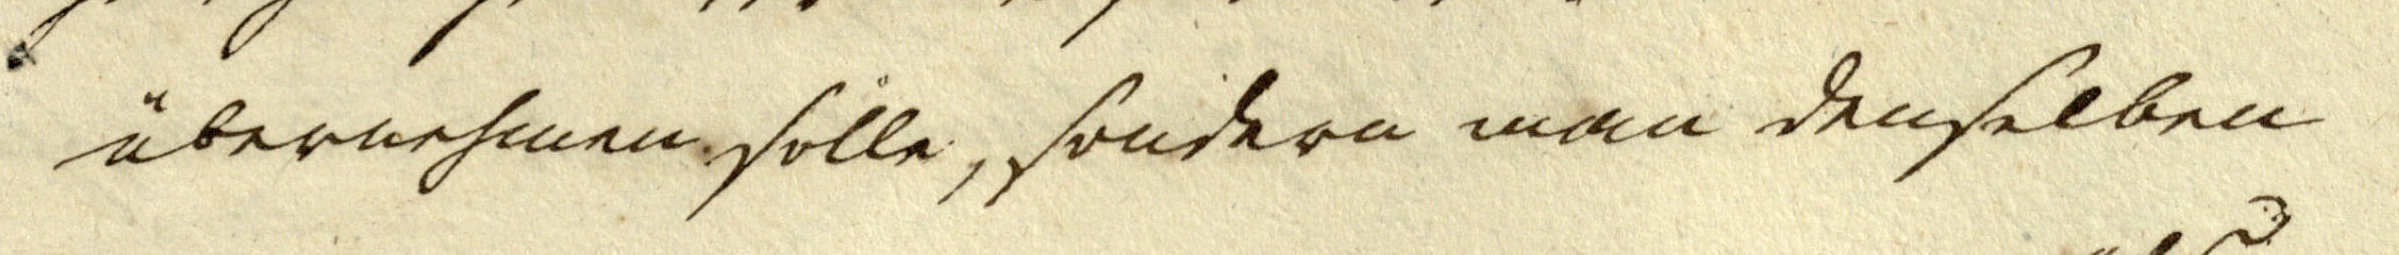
übernehmen solle, sondern man denselben
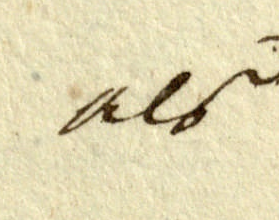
als
